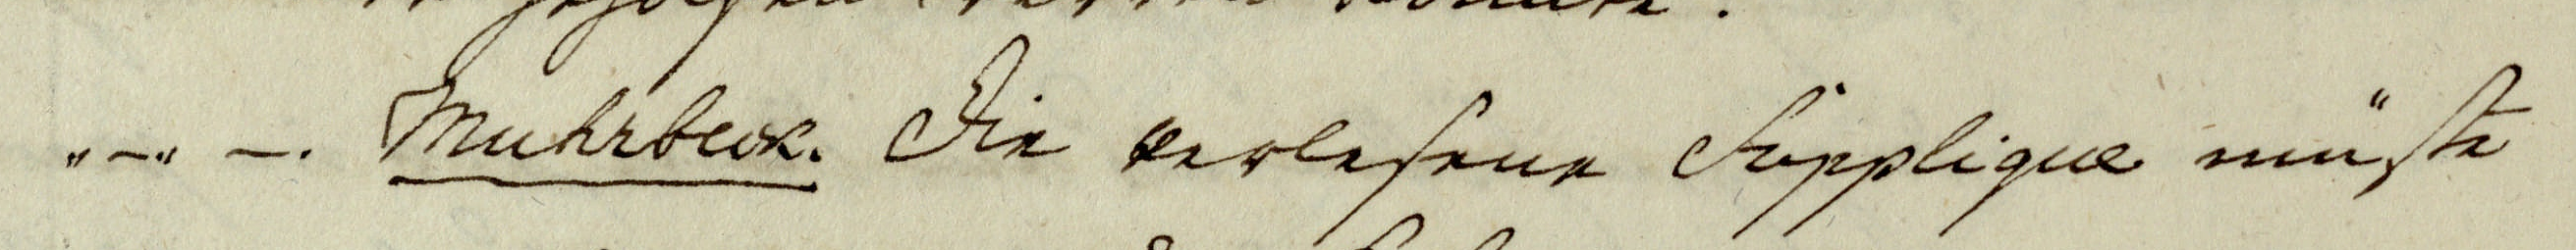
"—" — . Muhrbeck. Die verlesene Supplique müsste
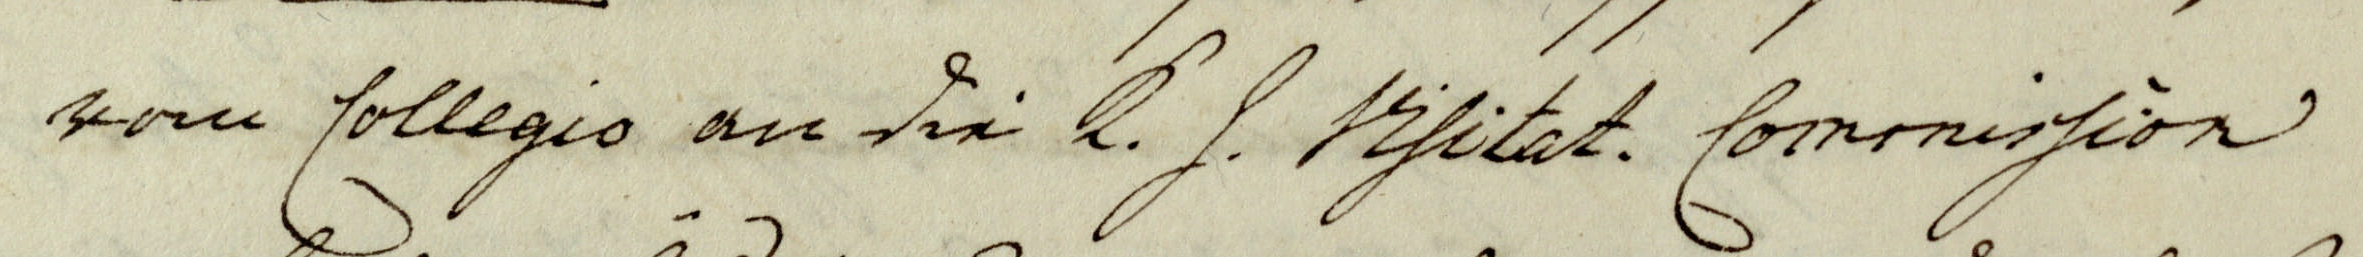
vom Collegio an die K. H. Visitat. Commission
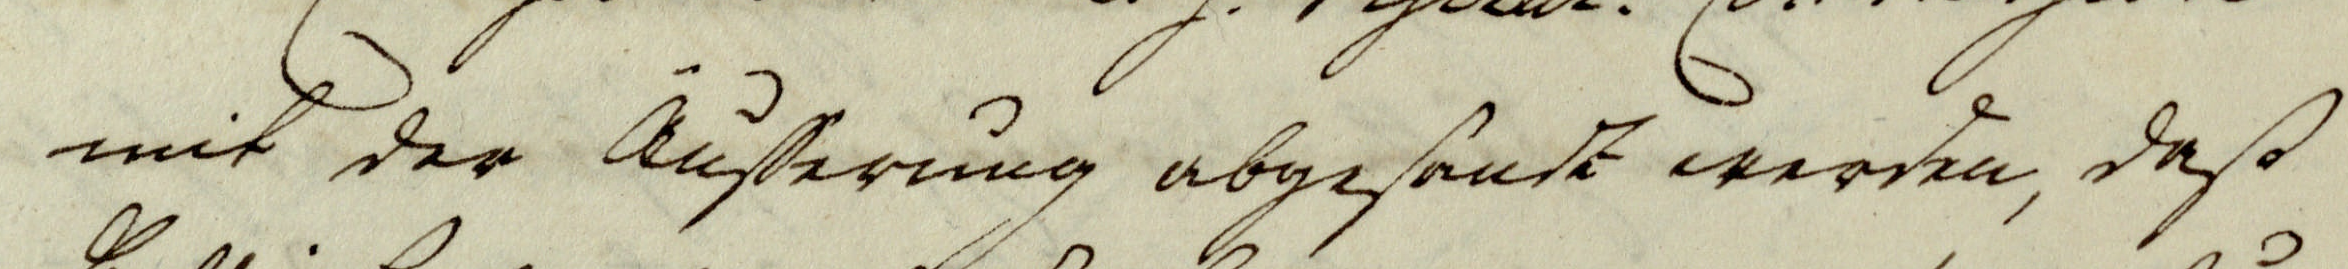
mit der Äußerung abgesandt werden, daß
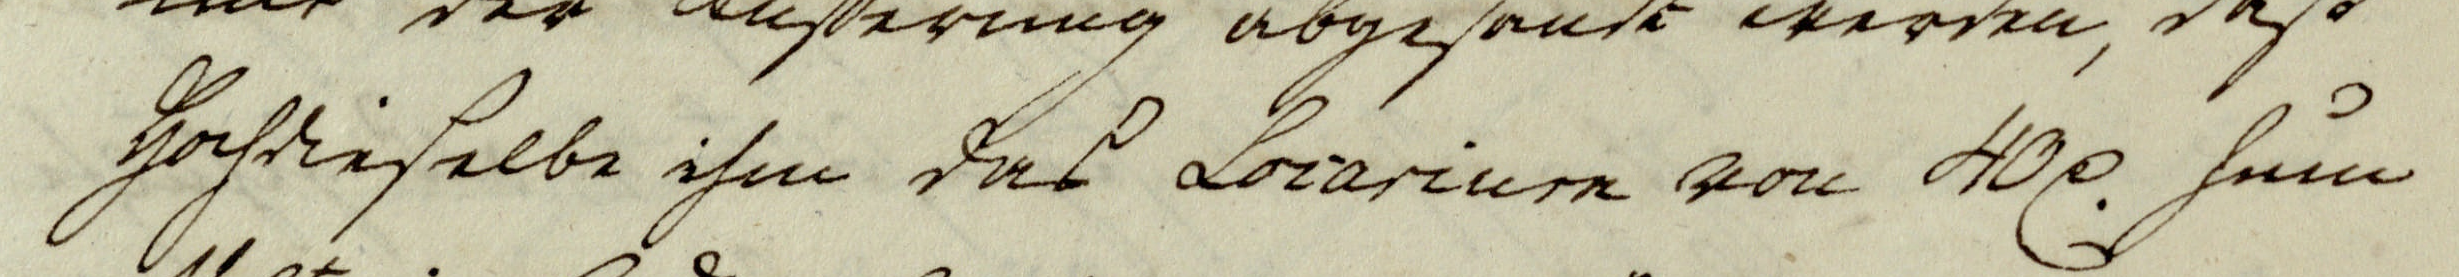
Hochdieselbe ihm das Locarium von 40 rtl. zum
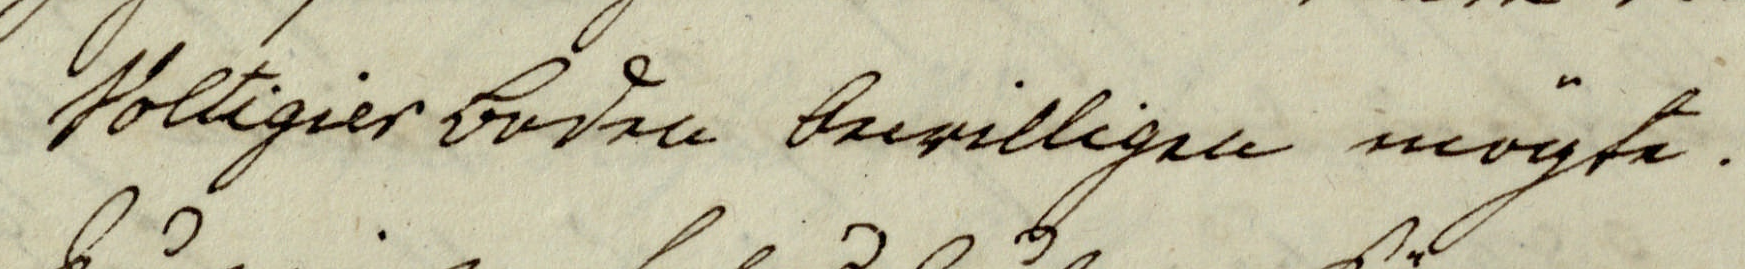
Voltigier Boden bewilligen möchte.
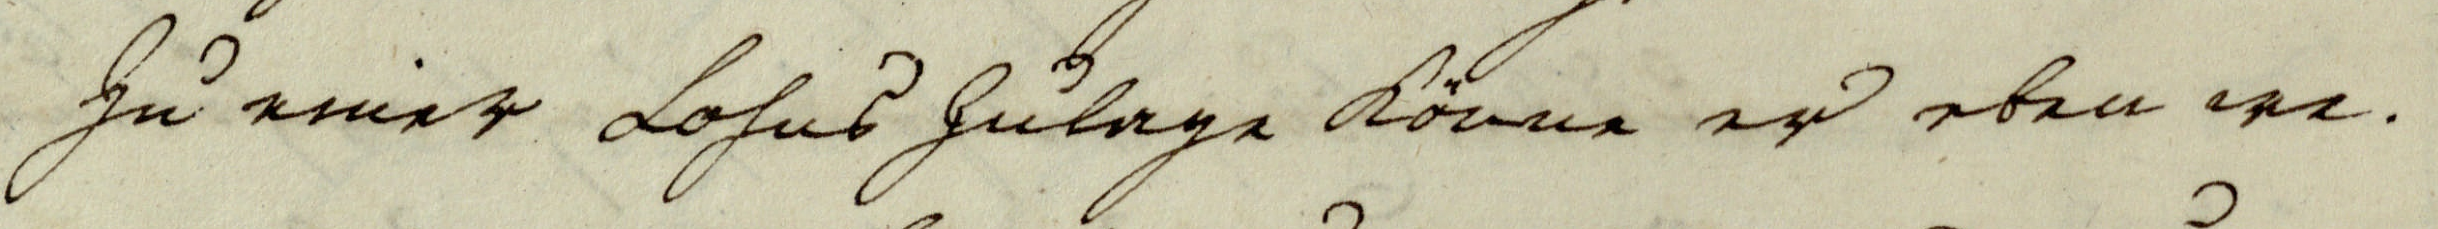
Zu einer Lohns Zulage könne er eben we¬
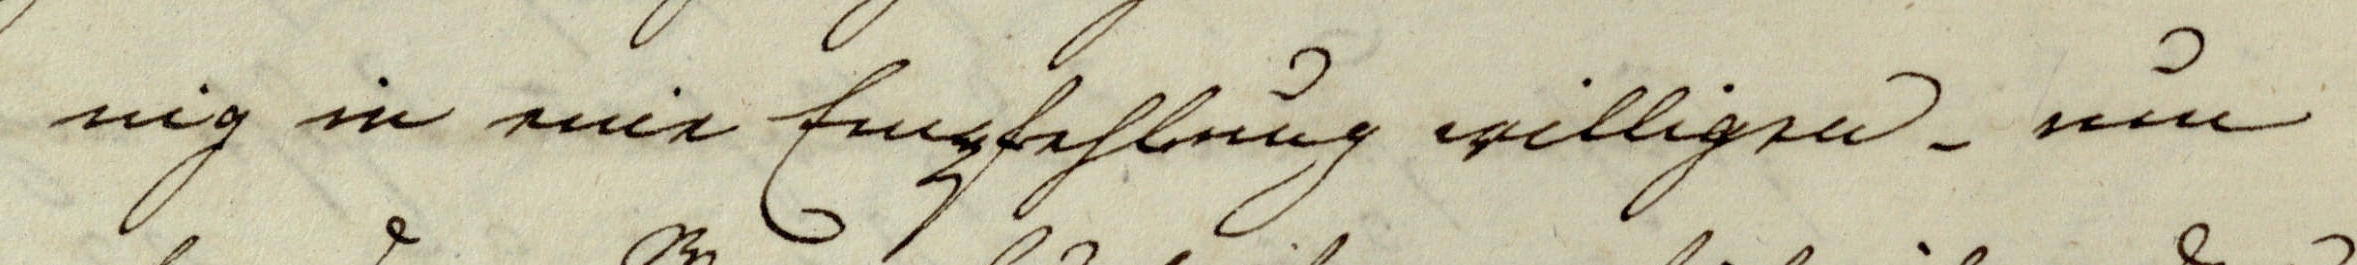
nig in eine Empfehlung willigen — um
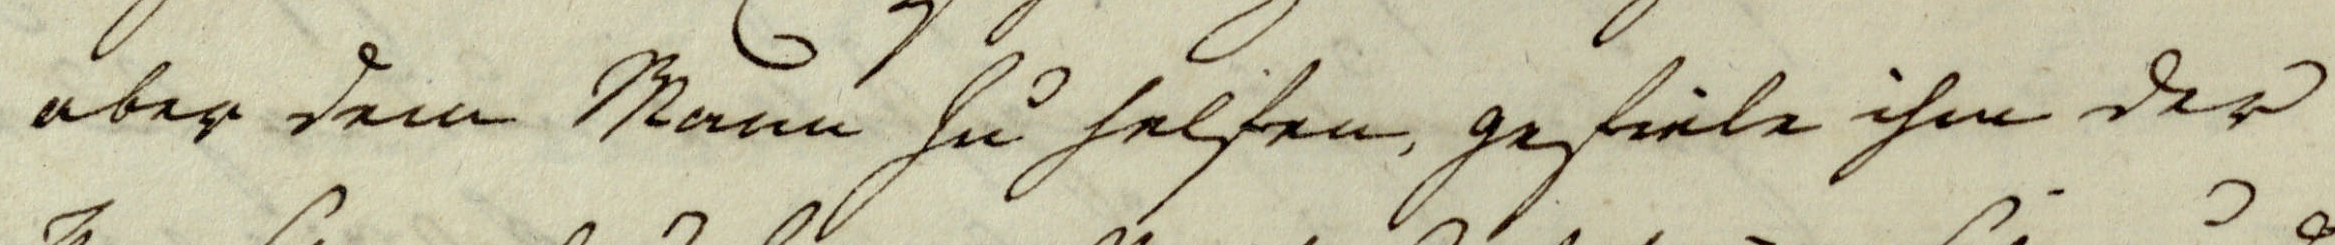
aber dem Mann zu helfen, gefiele ihm der
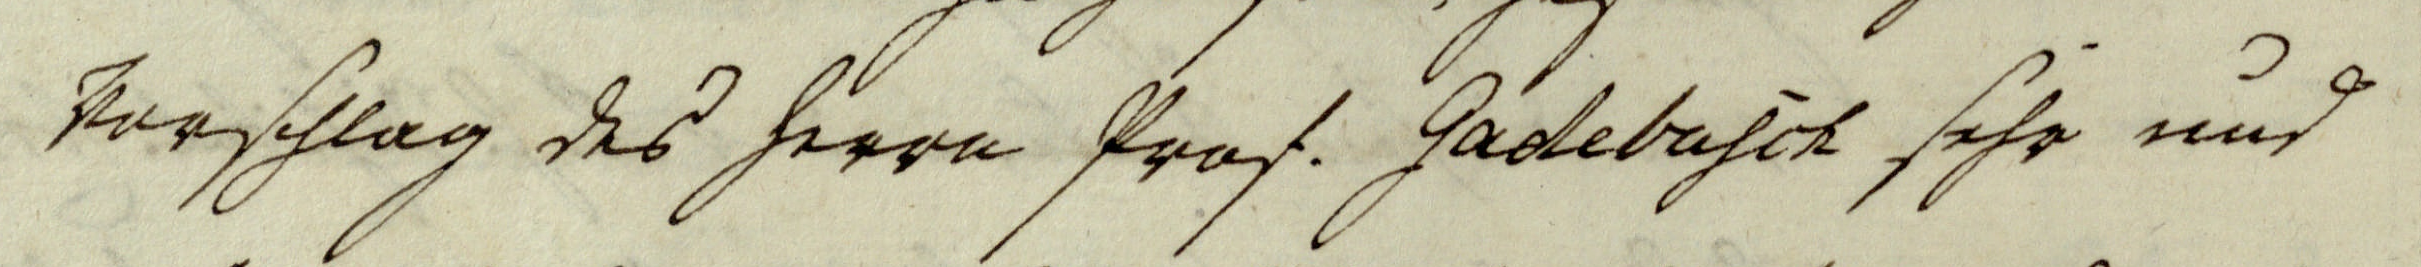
Vorschlag des Herrn Prof. Gadebusch sehr und
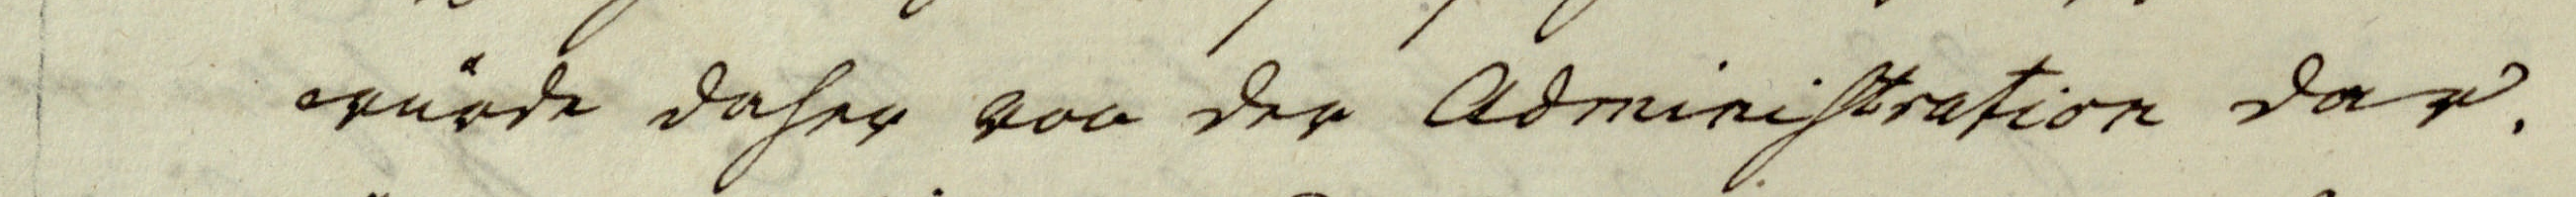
würde daher von der Administration dar¬
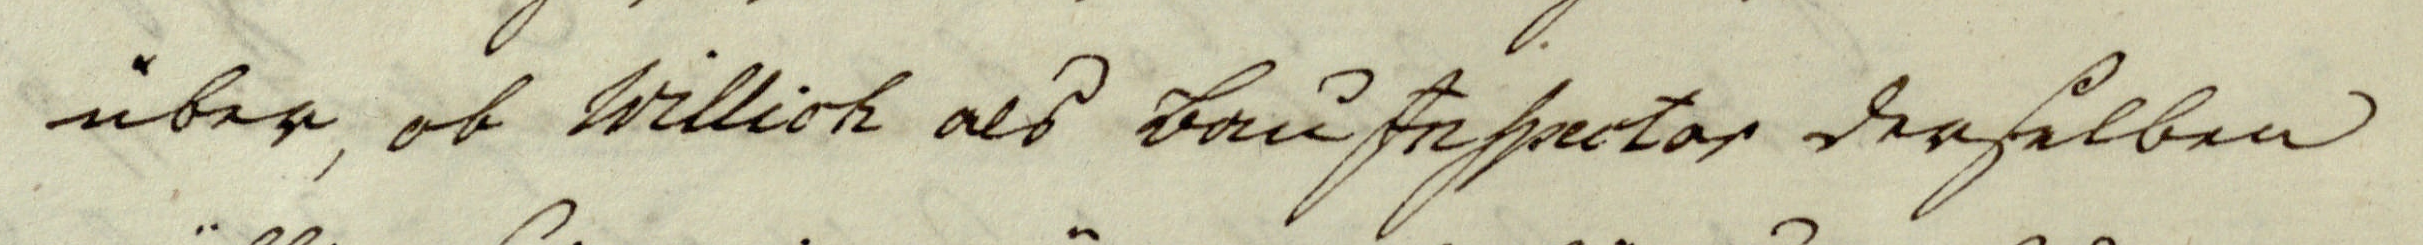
über, ob Willich als Bau Inspector derselben
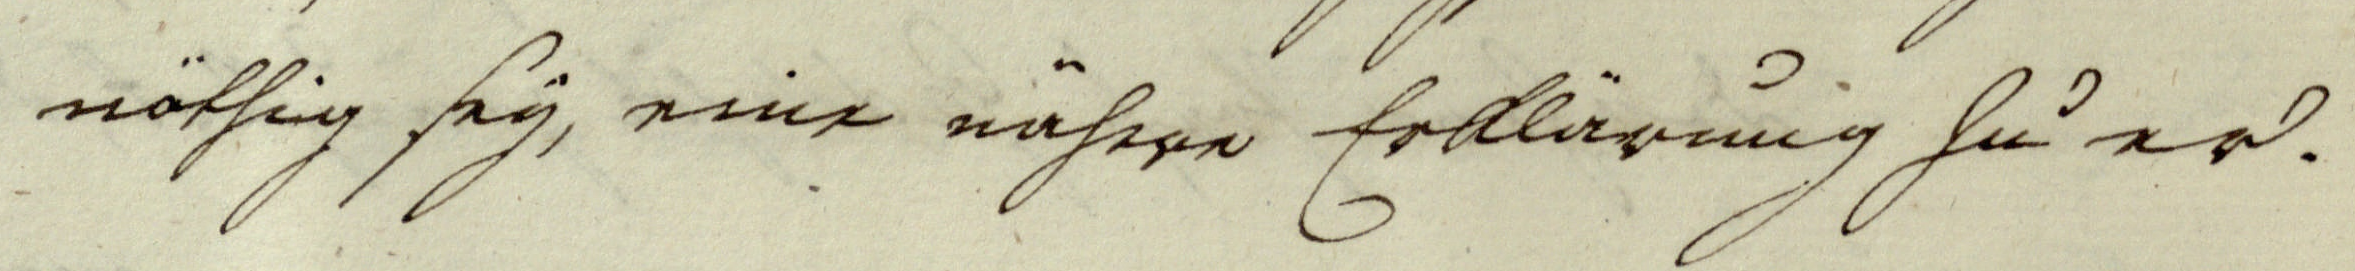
nöthig seÿ, eine nähere Erklärung zu er¬
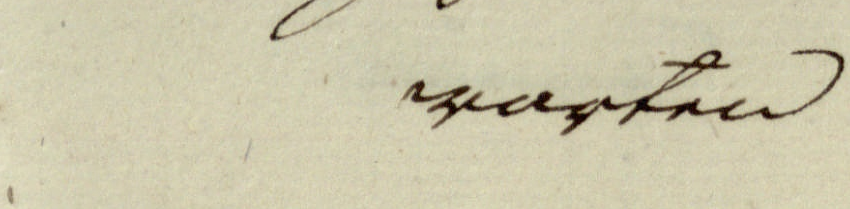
warten
